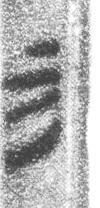天
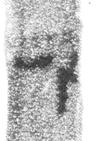下
